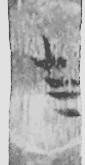十三
